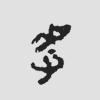李
